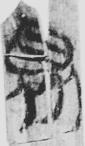衆
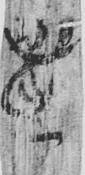○（一）
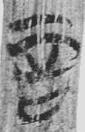言
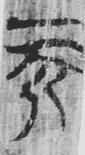而
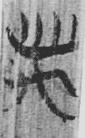萬
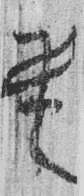民
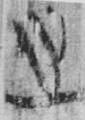之
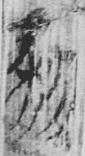利
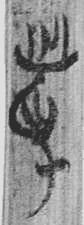○（一）
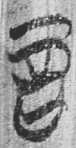言
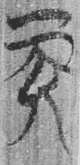而
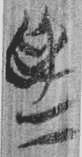爲
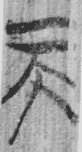天
